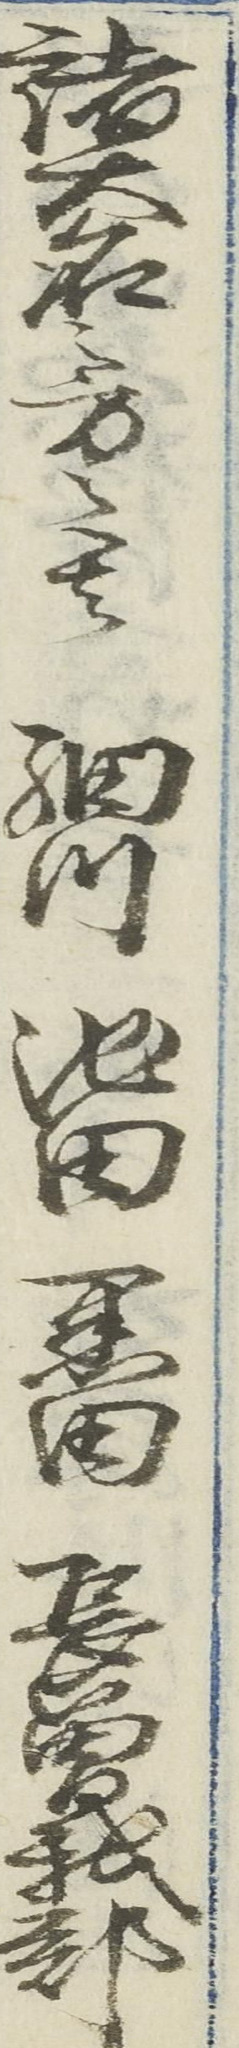諸大名之方ニは細川池田黒田長曾我部
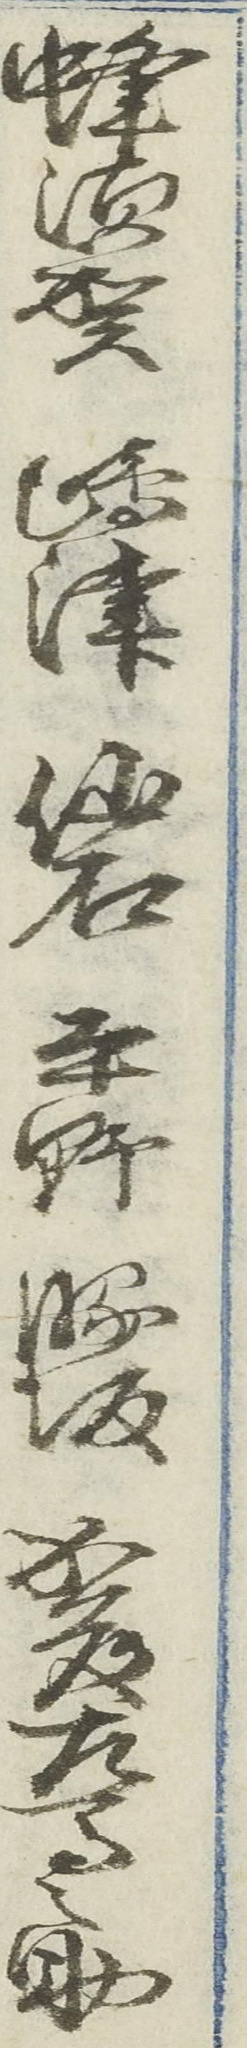蜂須賀嶋津仙石平野脇坂加藤左馬之助
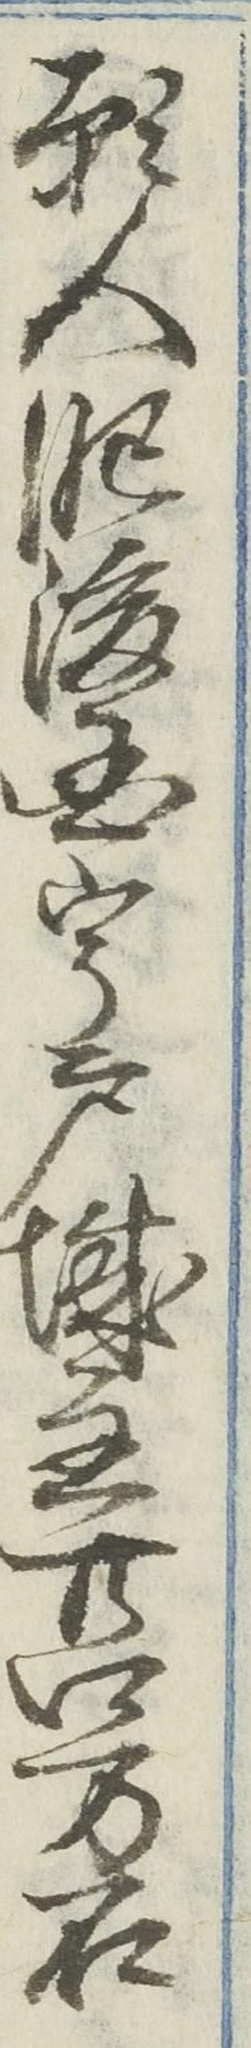願人肥後国宇戸城主廿四万石
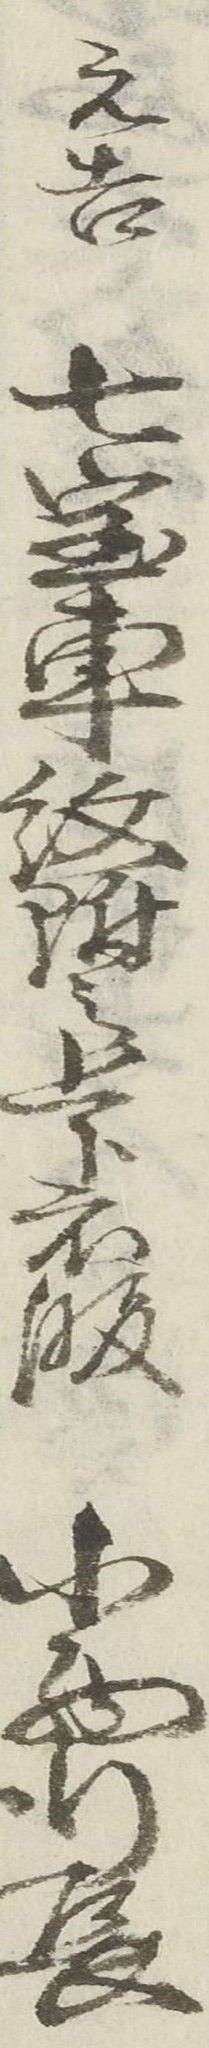元告七宝車紋附ニ上下衣服小西行長
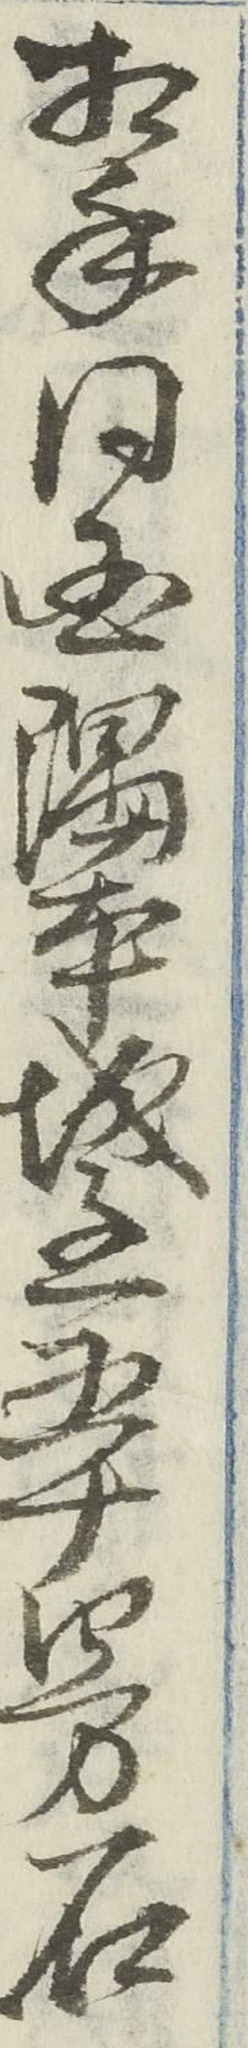相手同国隈本城主五十四万石
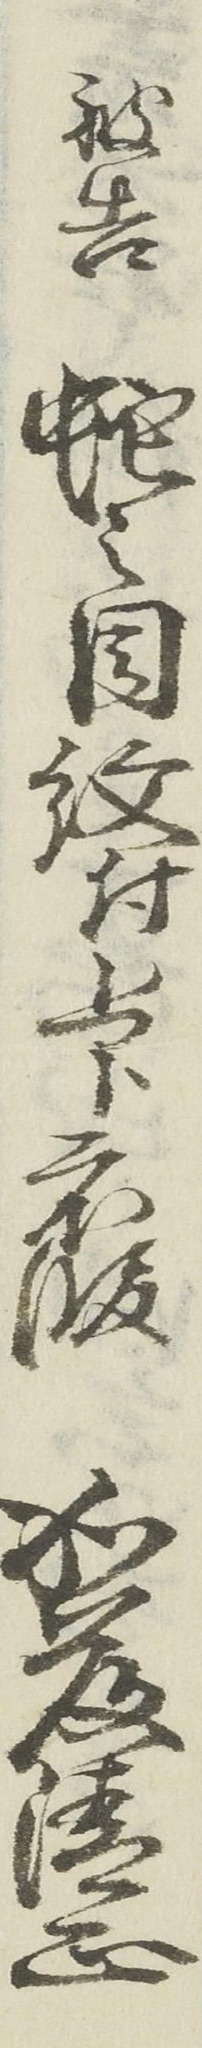被告蛇之目紋付上下衣服加藤清正
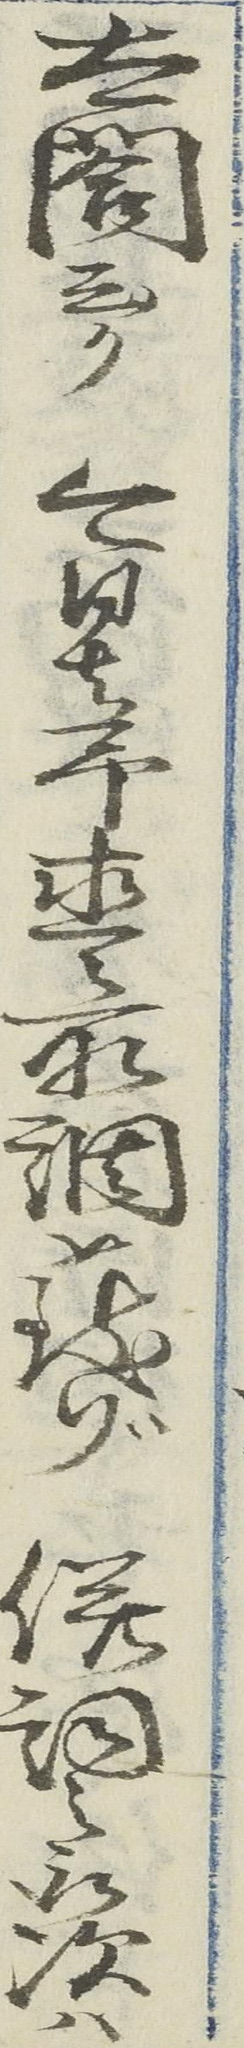太閤云ク今日は予直之取調ヲ致ゾ併詞之取次ハ
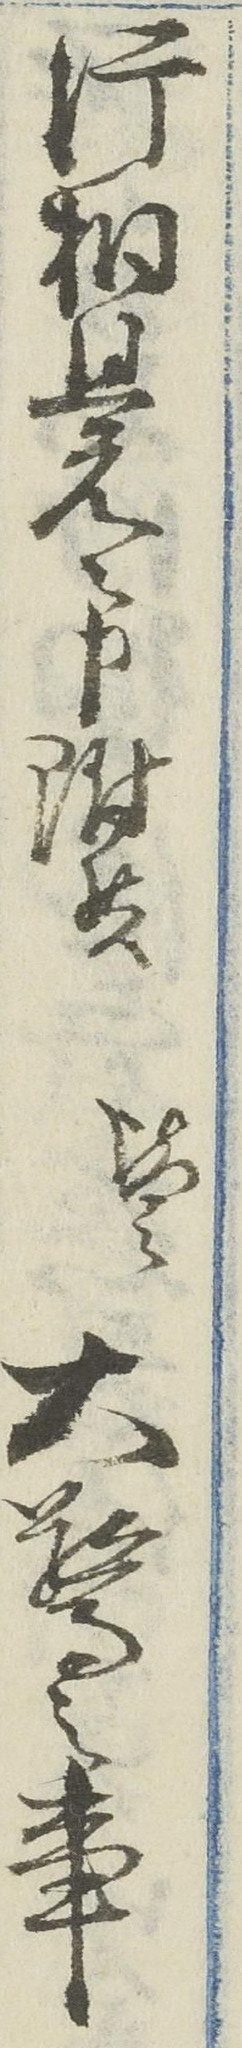片桐且元ニ申附候皆々大驚之事
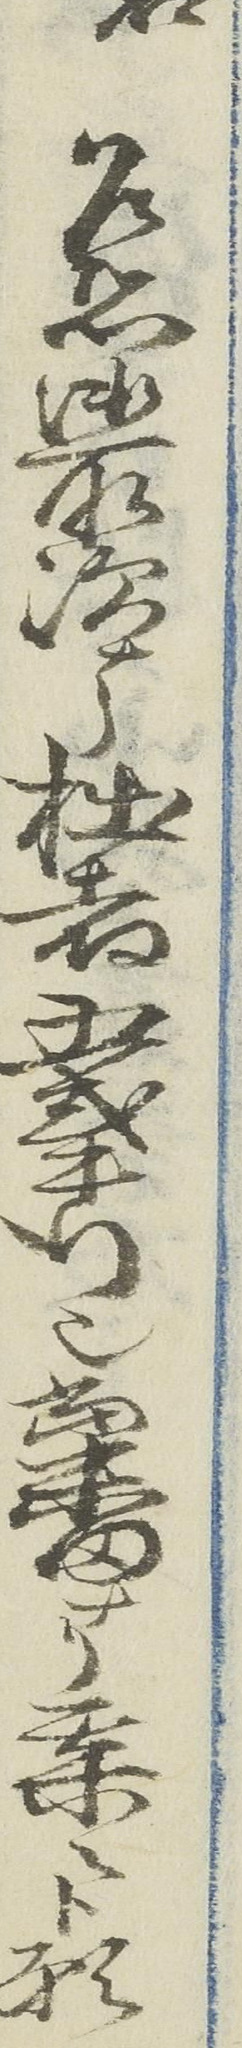石乍恐御取次之拙者五奉行也当番ナリ某ニト願

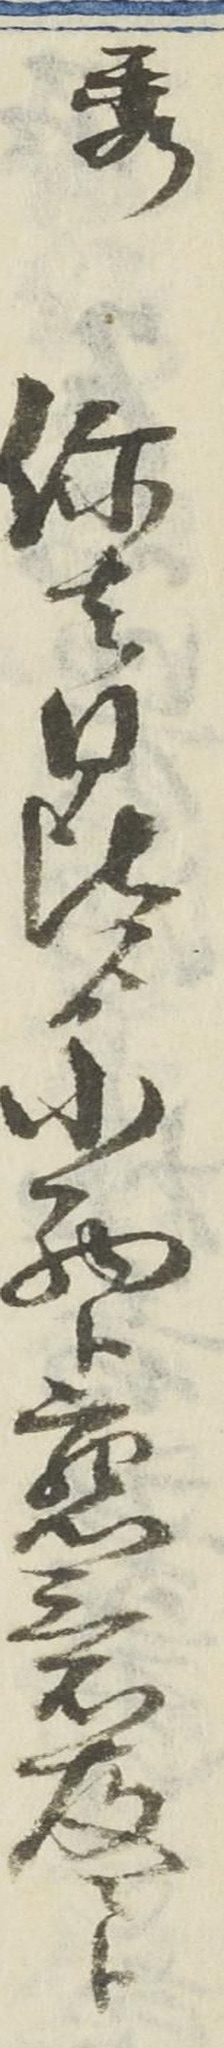秀你は日比ゟ小西ト懇意故ニト
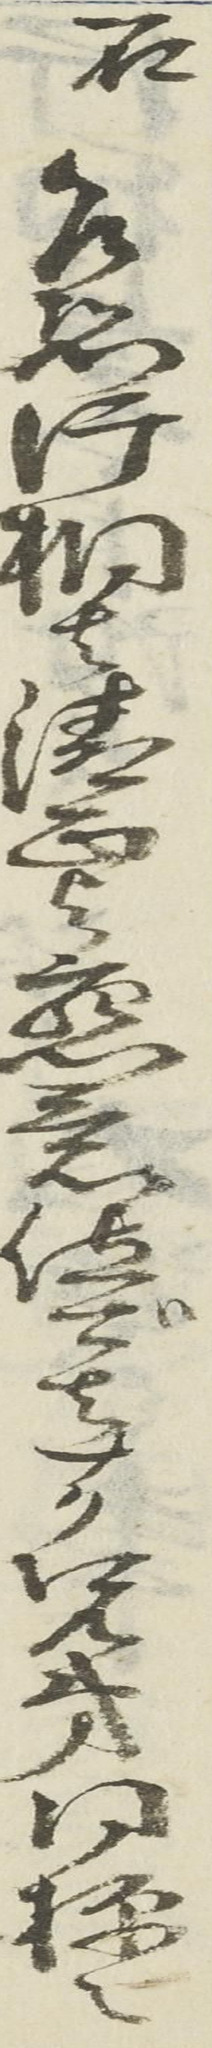石乍恐片桐は清正と懇意位ではナク兄弟同様ニ
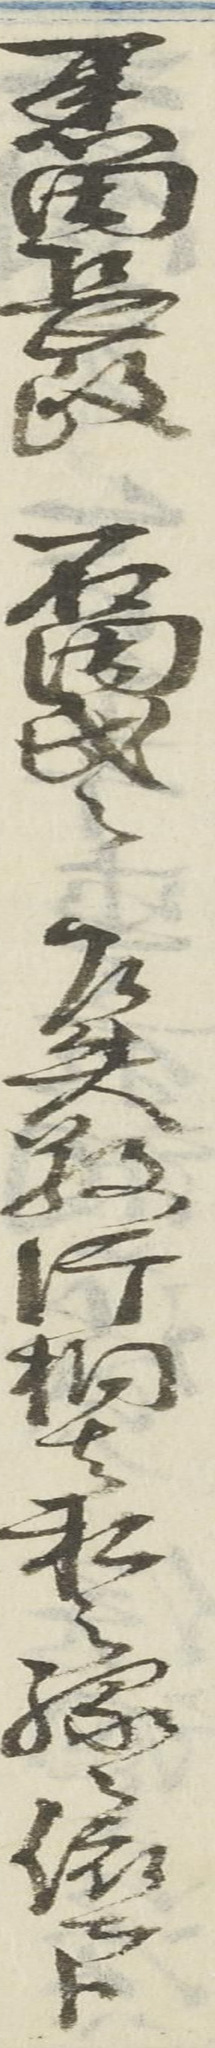黒田長政石田氏ニ乍失敬片桐は私之縁ニ依テト
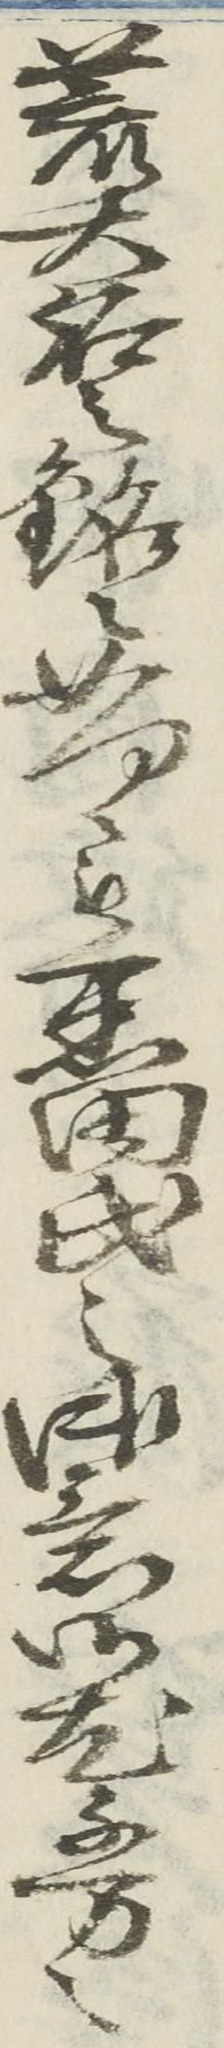荒大名之銘々如何ニも黒田氏御意御尤千万也
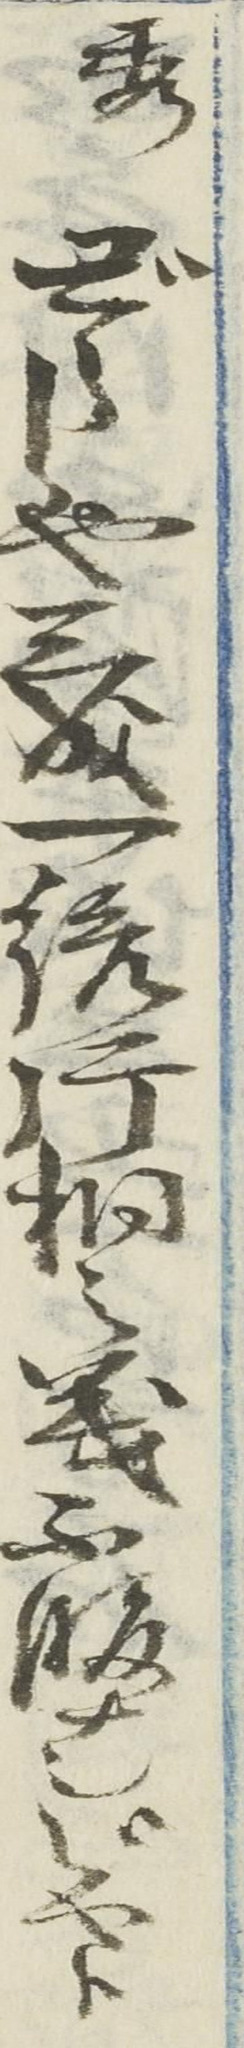秀どうしや三成一統片桐之義不服ナレバじゃト
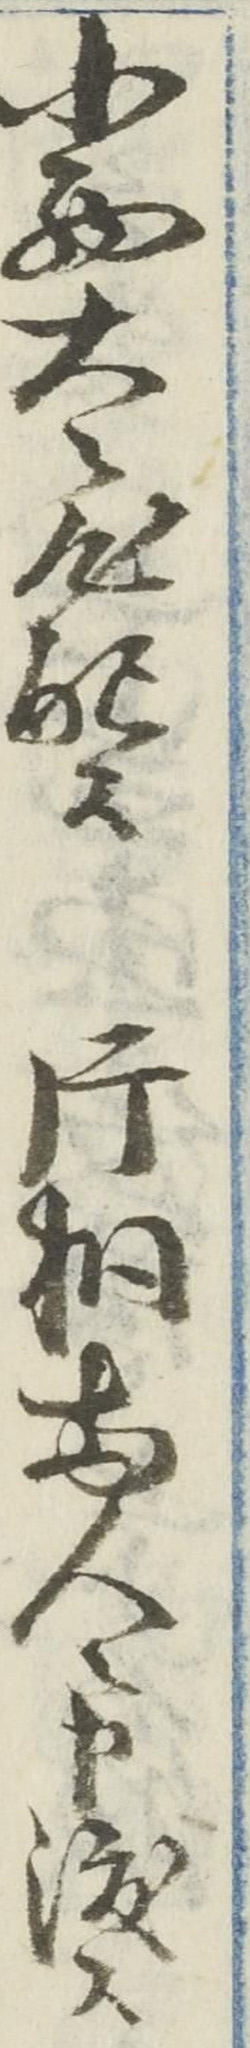小西大之心配ス片桐両人ニ申渡ス
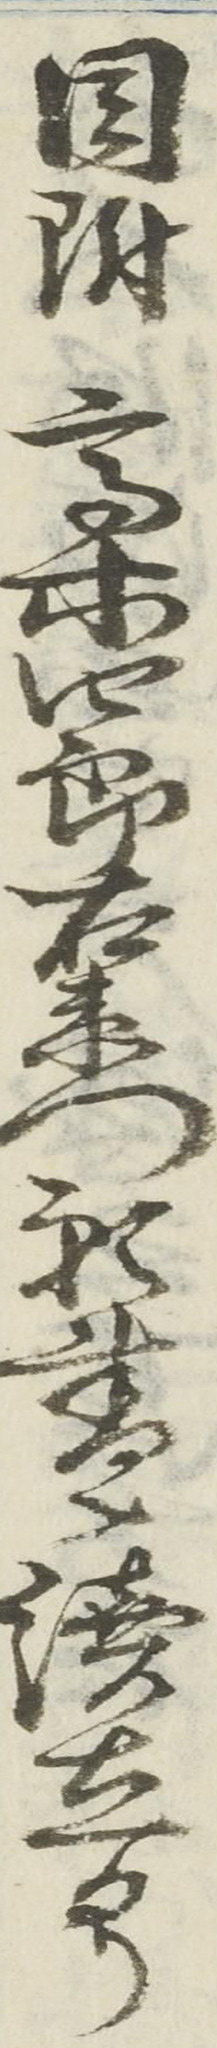目附高木四郎右衛門願書を読立たり
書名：伏水大地震
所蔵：東京大学地震研究所図書室 Earthquake Research Institute Library, The University of Tokyo, JAPAN
